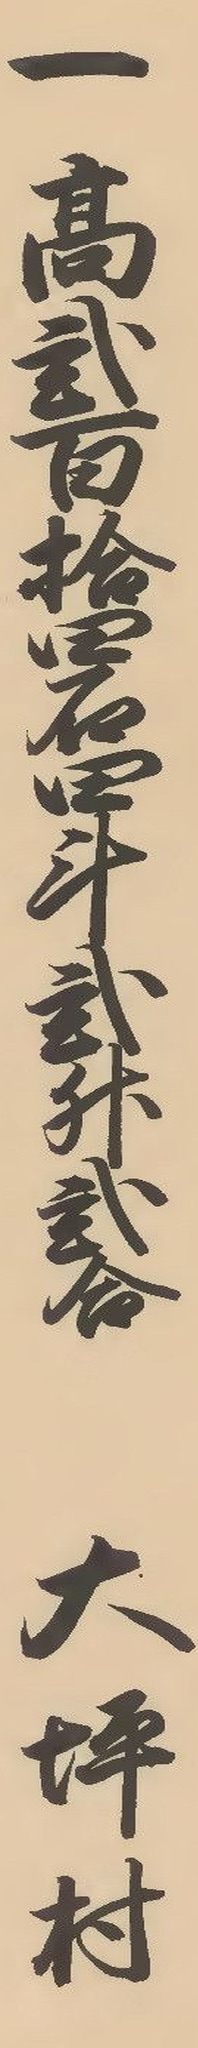一高弐百拾四石四斗弐升弐合大坪村
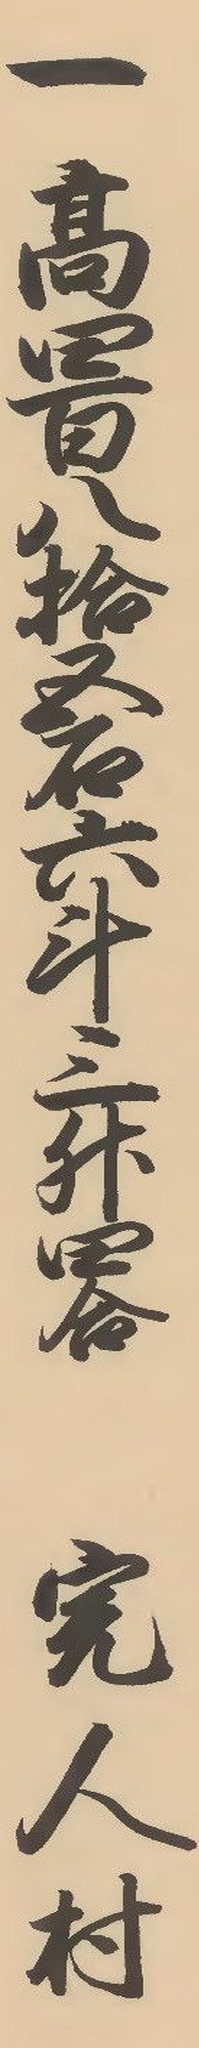一高四百八拾五石六斗三升四合宍人村
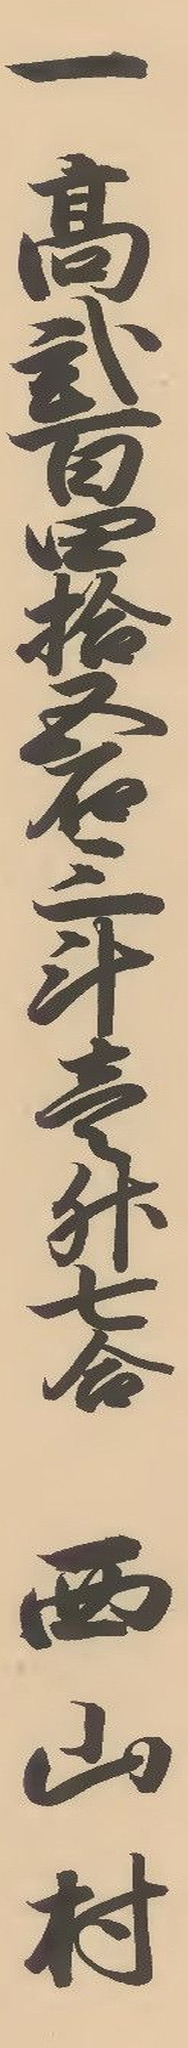一高弐百四拾五石三斗壱升七合西山村

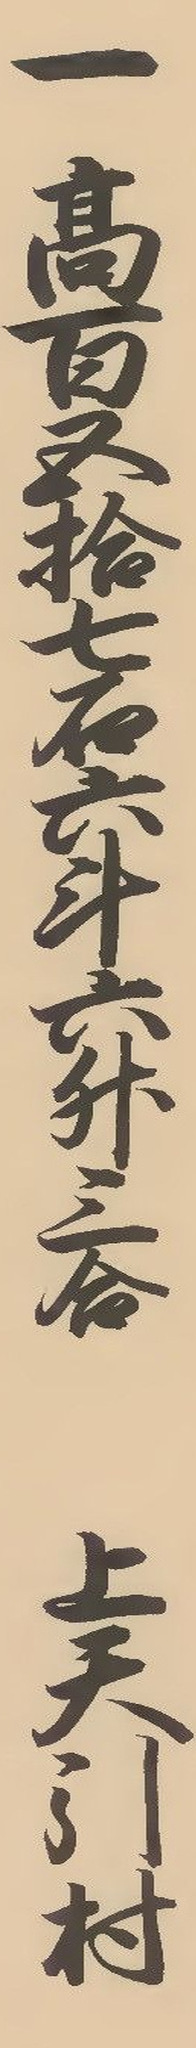一高百五拾七石六斗六升三合上天引村
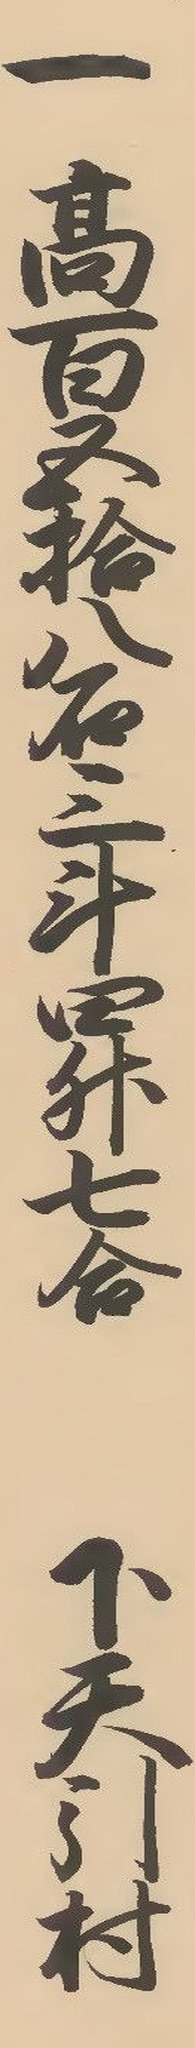一高百五拾八石三斗四升七合下天引村
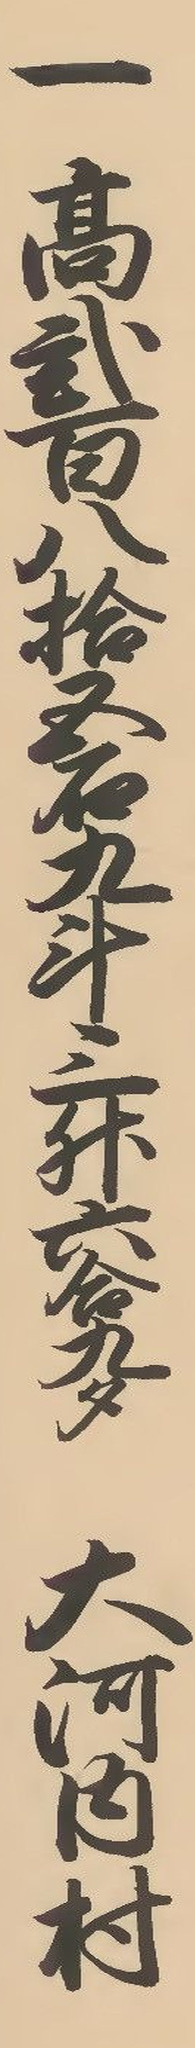一高弐百八拾五石九斗三升六合九勺大河内村
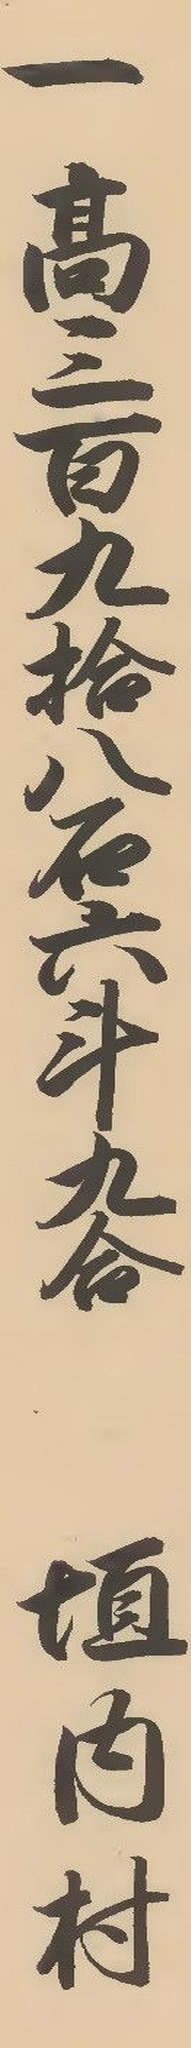一高三百九拾八石六斗九合垣内村
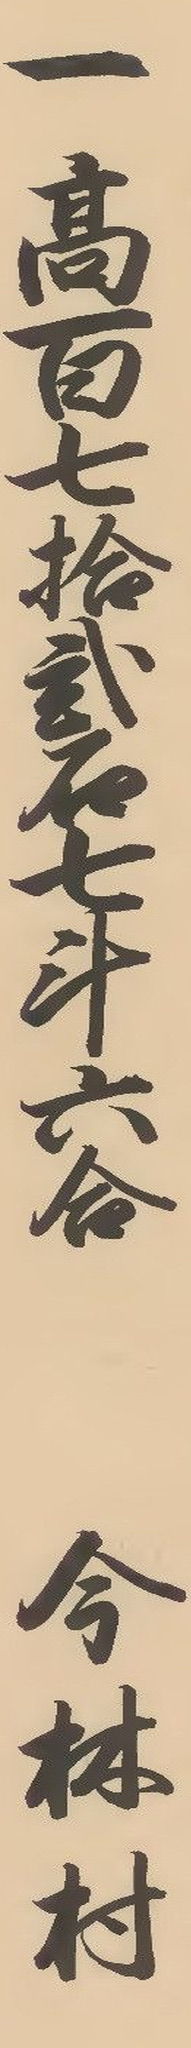一高百七拾弐石七斗六合今林村

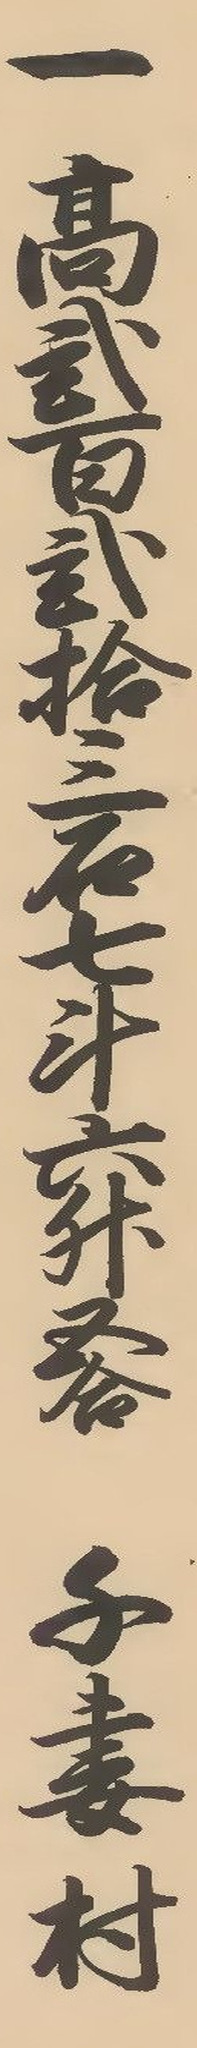一高弐百弐拾三石七斗六升五合千妻村
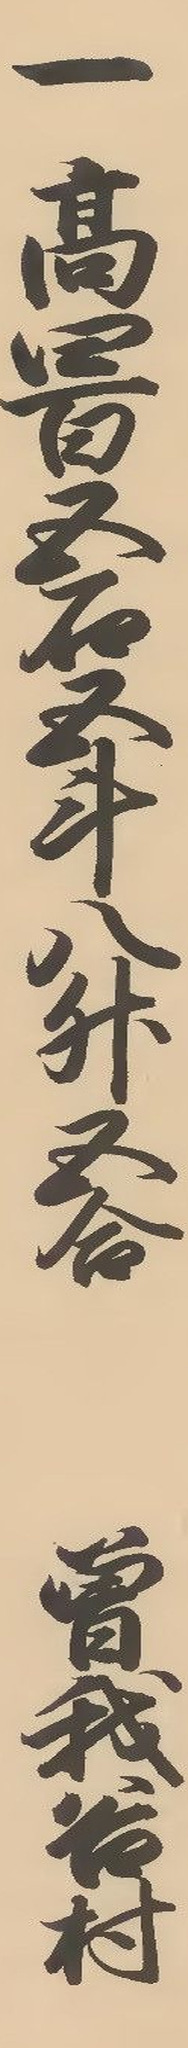一高四百五石五斗八升五合曽我谷村
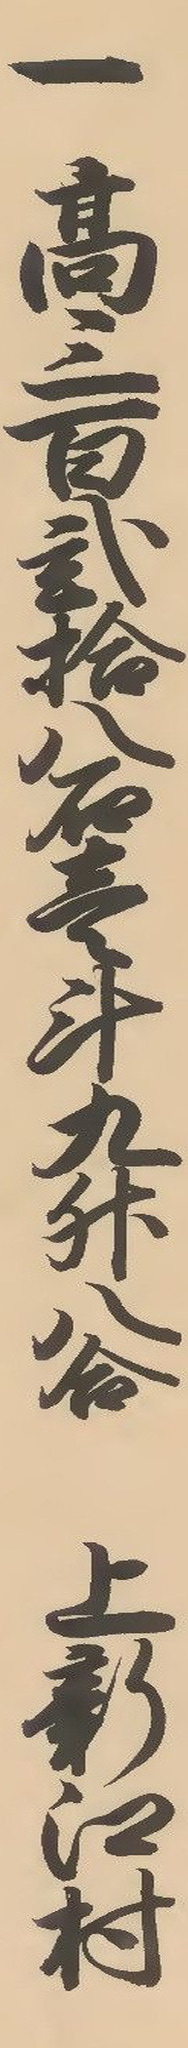一高三百弐拾八石壱斗九升八合上新江村
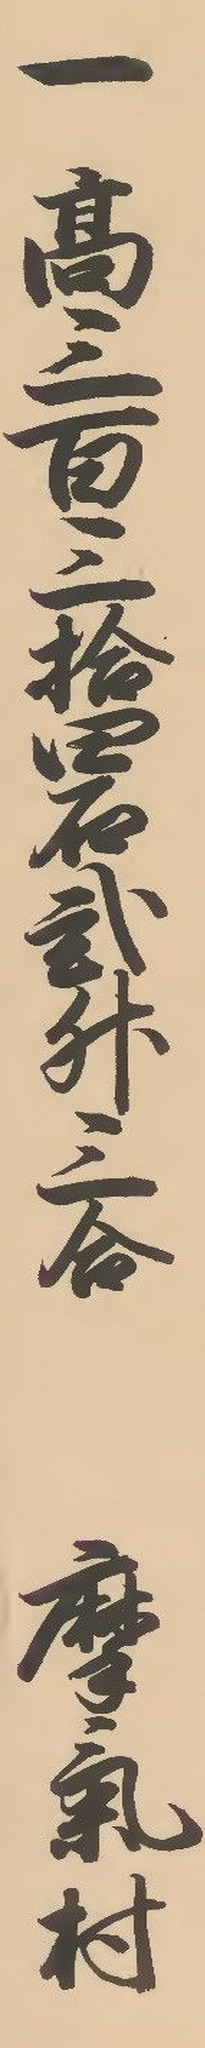一高三百三拾四石弐升三合摩気村
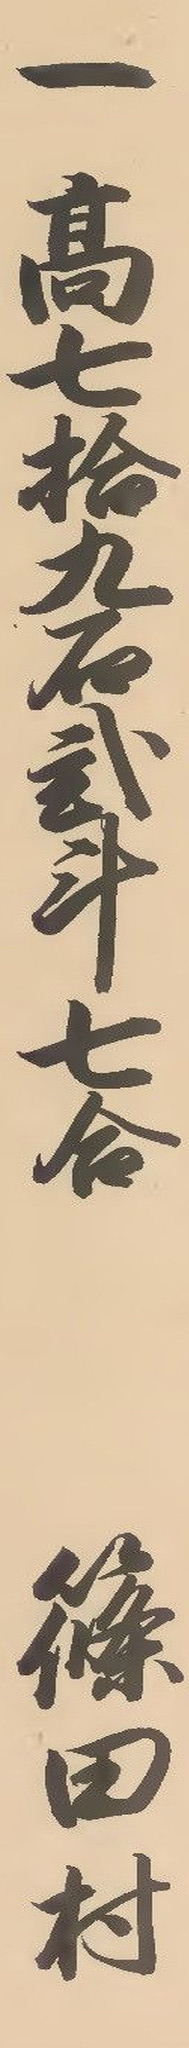一高七拾九石弐斗七合篠田村
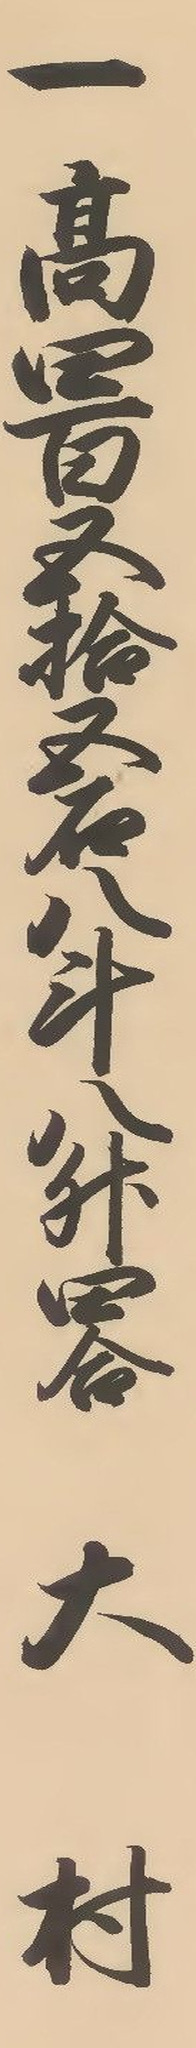一高四百五拾五石八斗八升四合大村

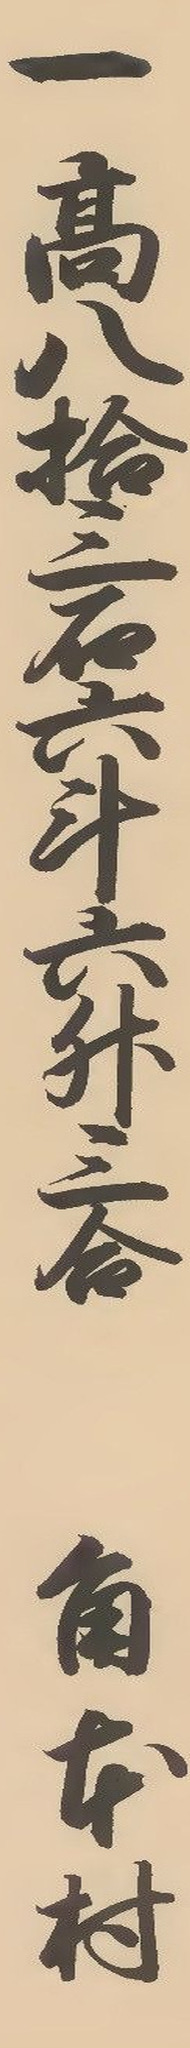一高八拾三石六斗六升三合角本村
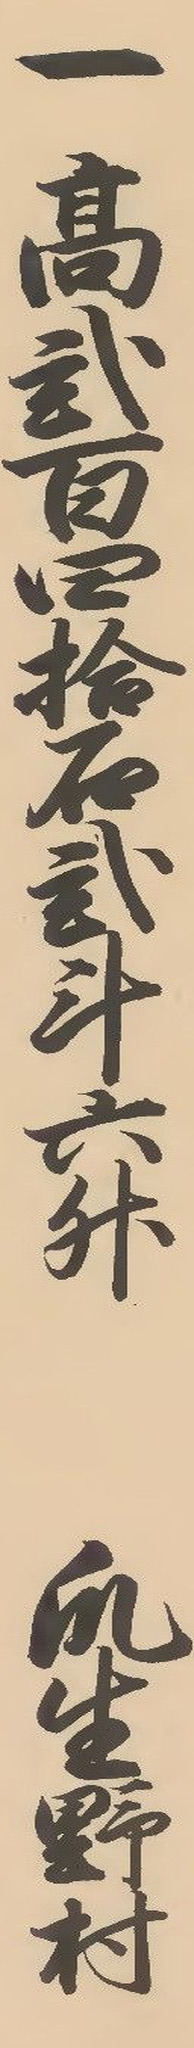一高弐百四拾石弐斗六升瓜生野村
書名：丹波国郷帳
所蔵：国立公文書館 National Archives of Japan
